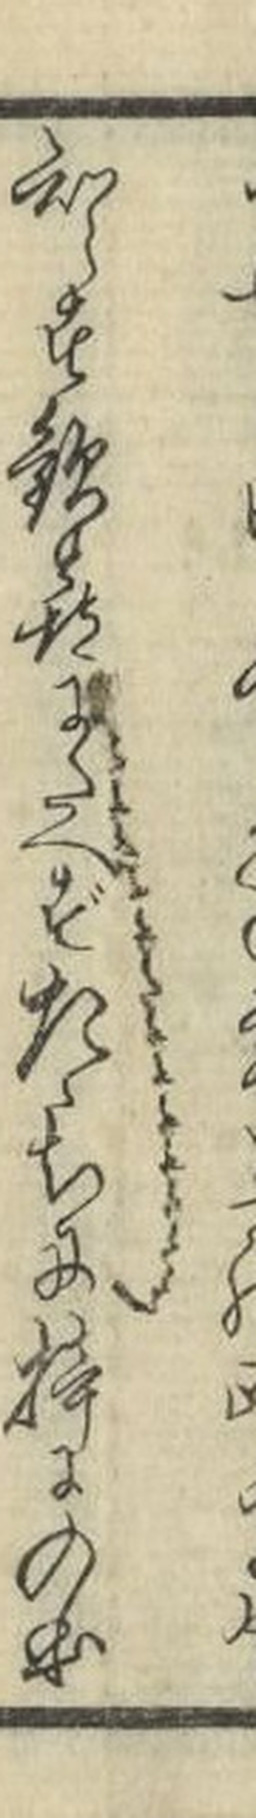知らす歓喜にたへずたゝちに梓にのほ
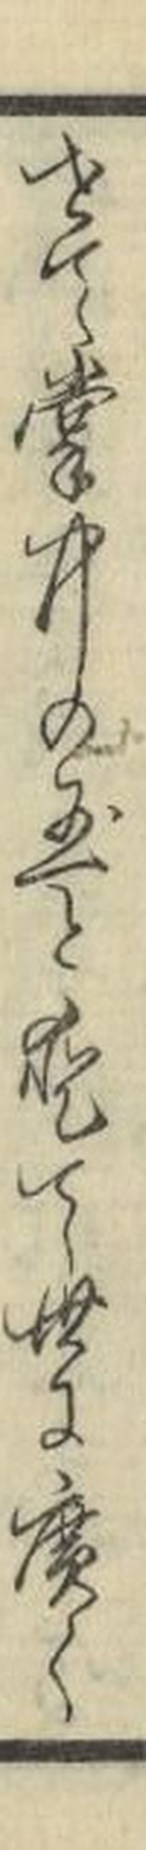せて掌中の玉と愛て世に広く
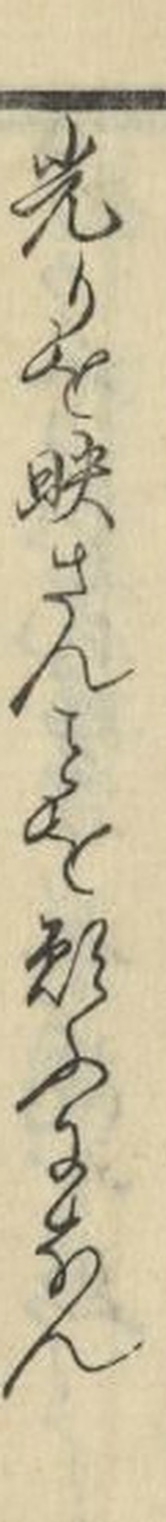光りを映さんことを願ふになん
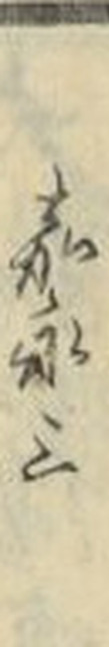嘉永三
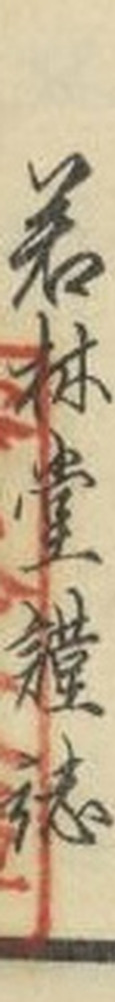若林堂謹誌
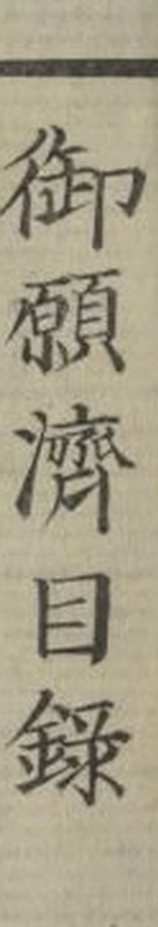御願済目録
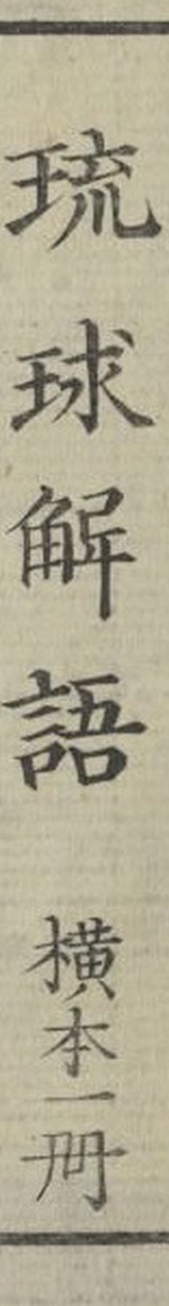琉球解語横本一冊
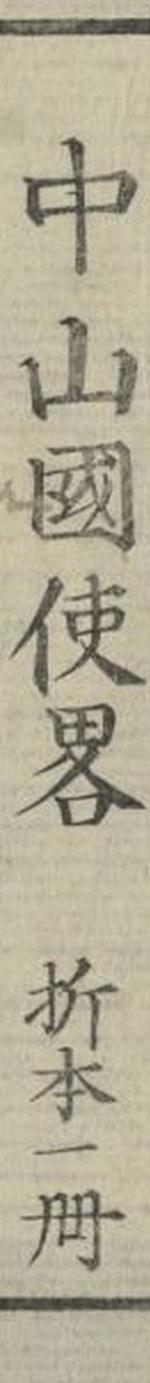中山国使略折本一冊
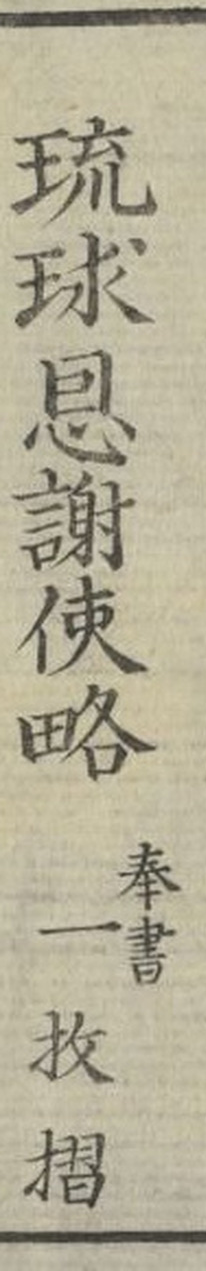琉球恩謝使略一枚摺
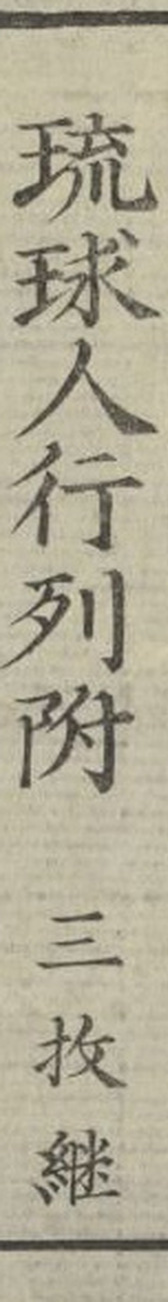琉球人行列附三枚継
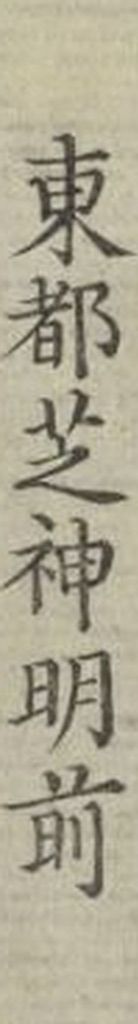東都芝神明前
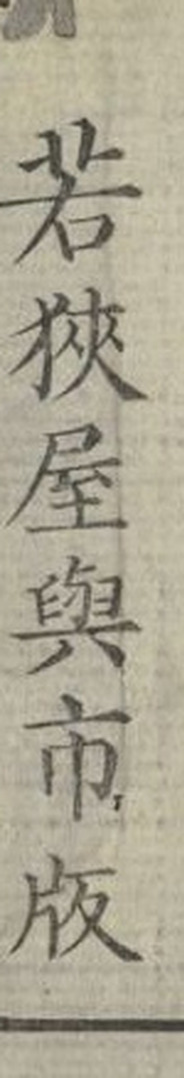若狭屋与市版
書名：琉球解語
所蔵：University of the Ryukyus Library
